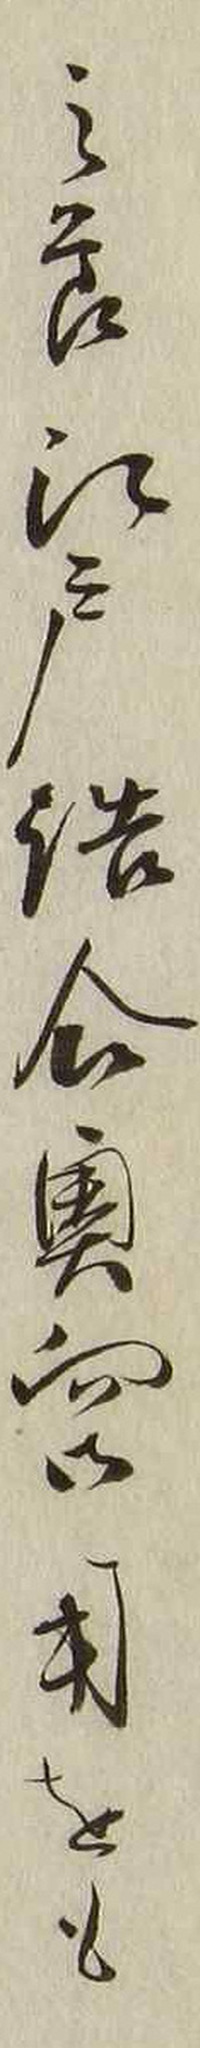之節江戸詰合奥向御用をも
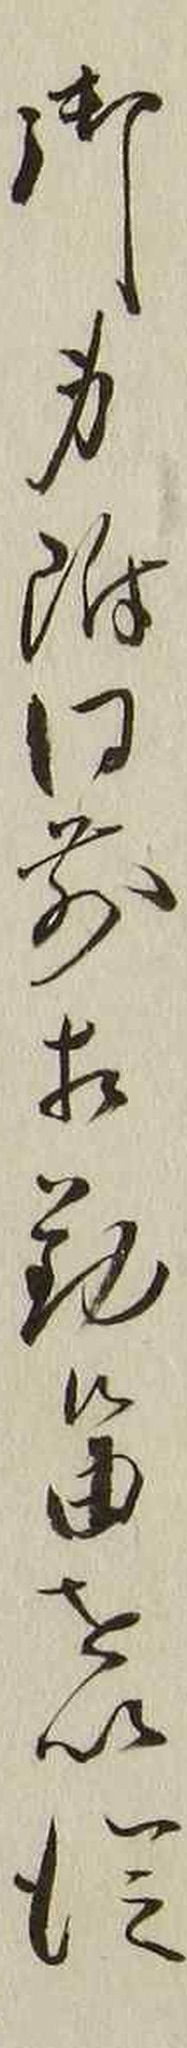御身附同前相勤候由を以従
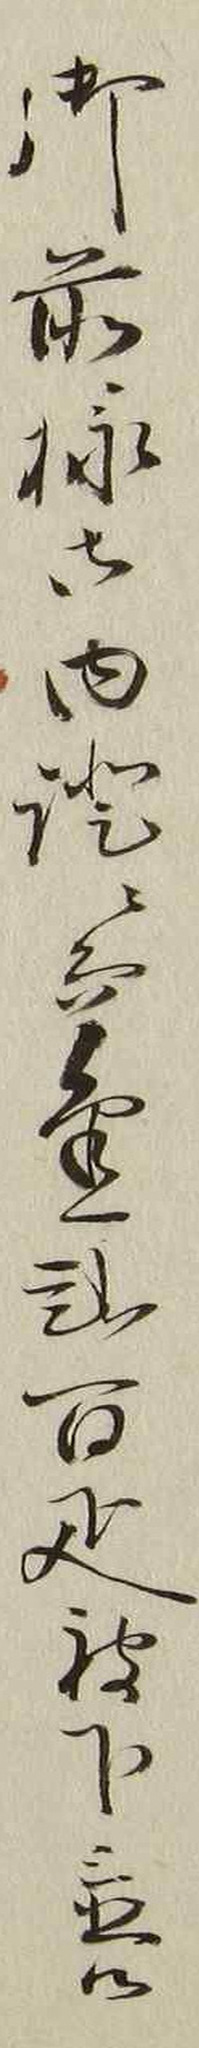御前様御内証ニ而金弐百疋被下置候
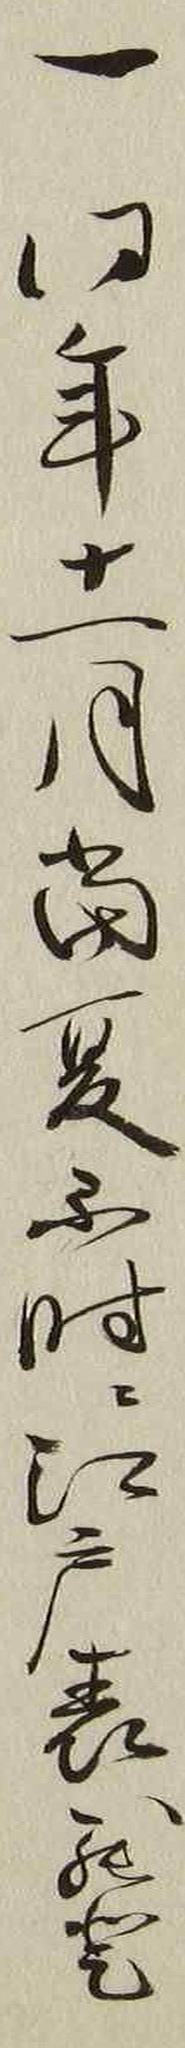一同年十一月当夏不時ニ江戸表ㇸ罷登
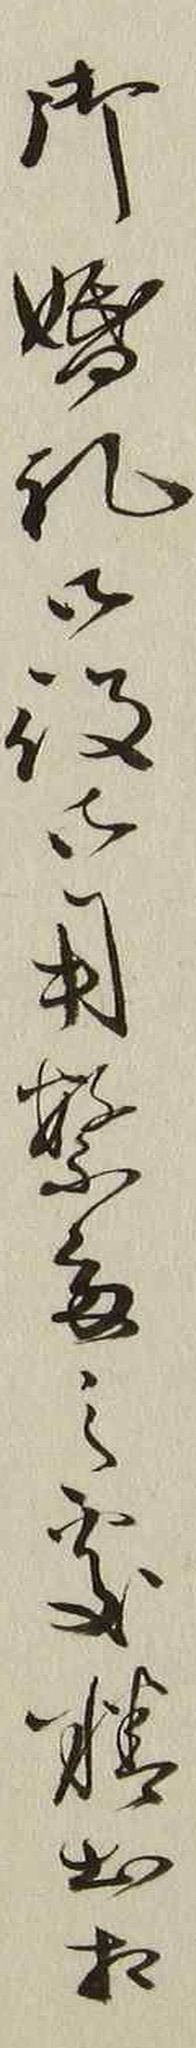御婚礼御役御用繁多之処精出相
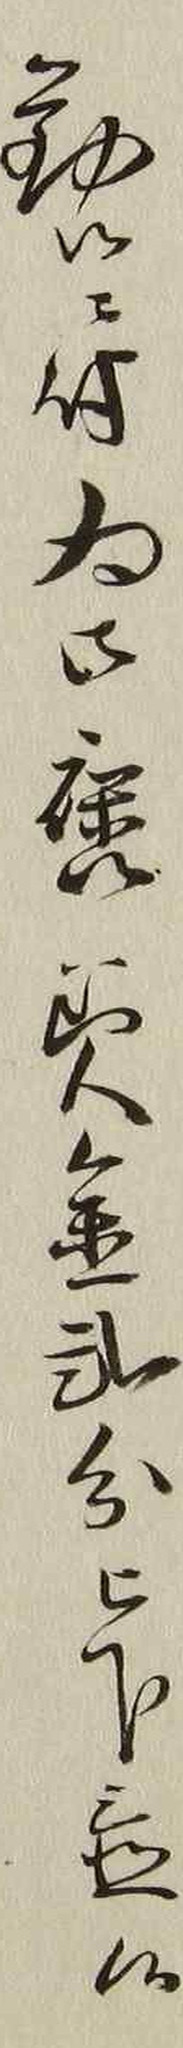勤候ニ付為御褒美金弐分被下置候
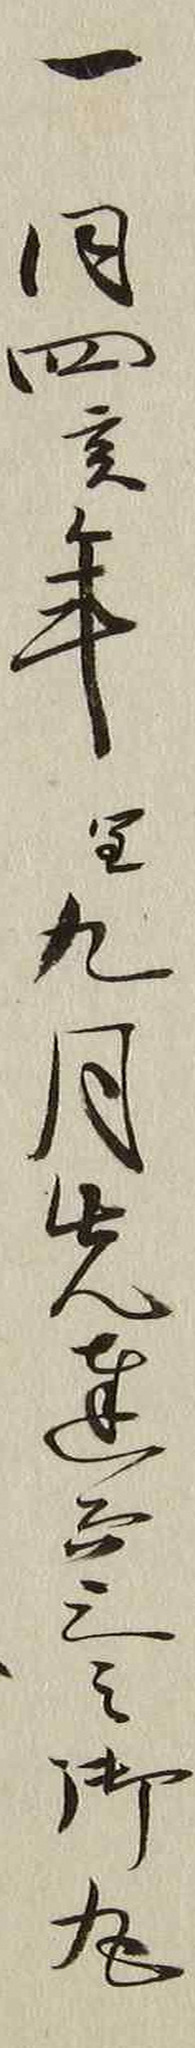一同四亥年閏九月先達而之三之御丸
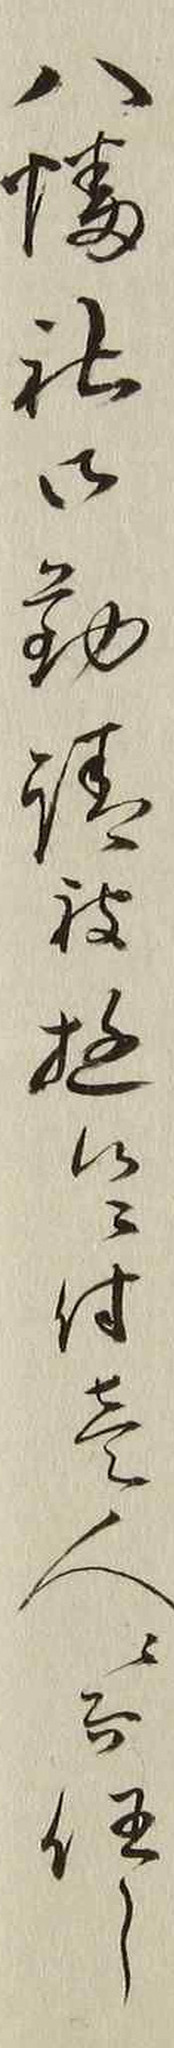八幡社御勤請被遊候ニ付壱人ニ而任し
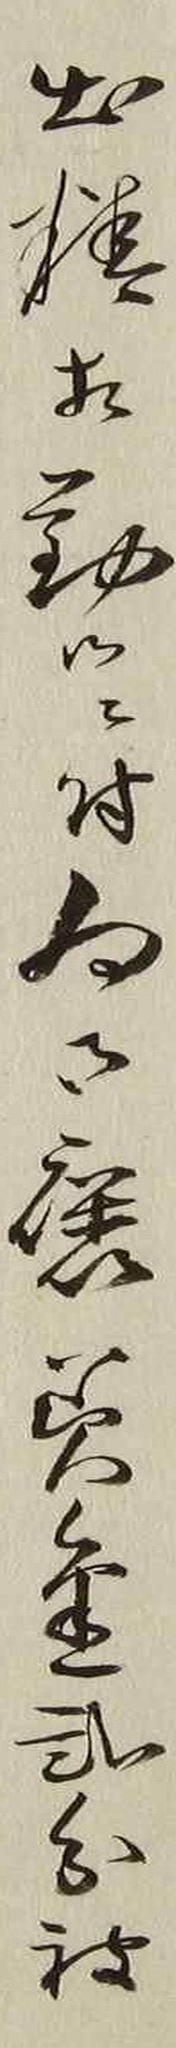出精相勤候ニ付為御褒美金弐分被
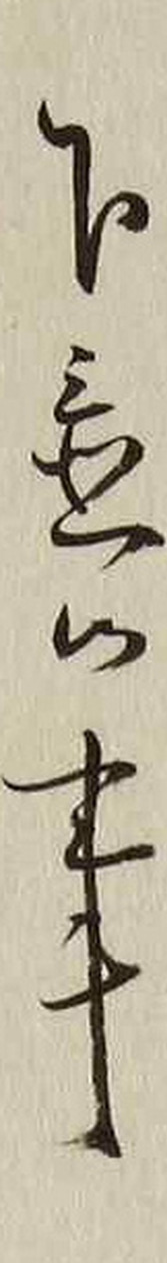下置候事
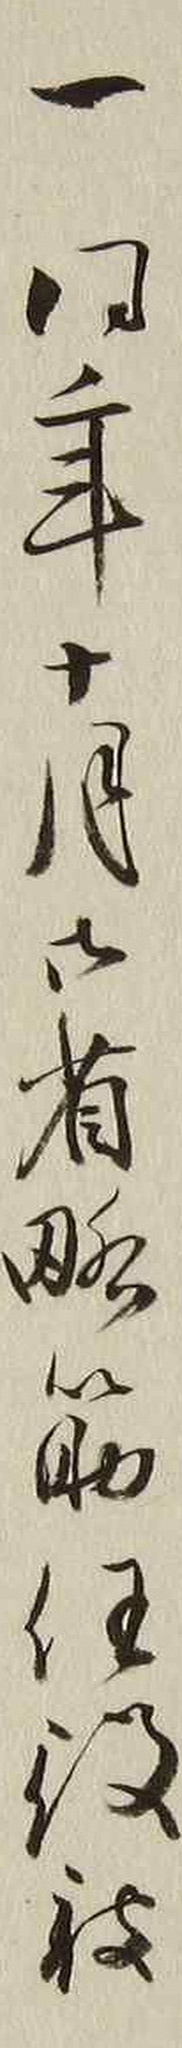一同年十月御省略筋任役被
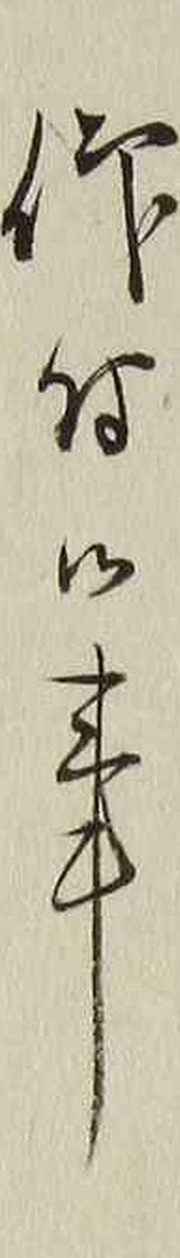仰付候事
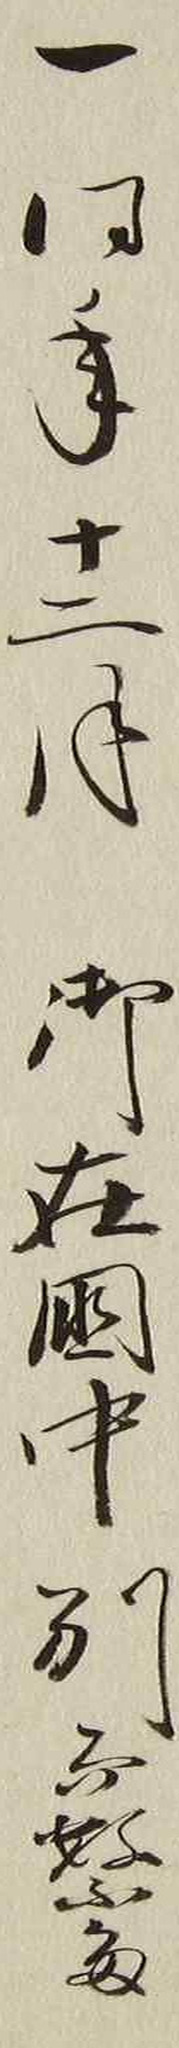一同年十二月御在国中別而繫多
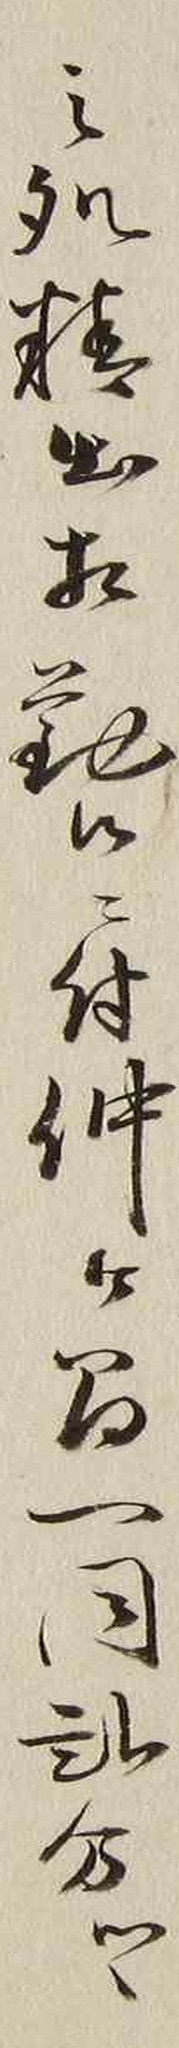之処精出相勤候ニ付仲ヶ間一同弐分ツヽ
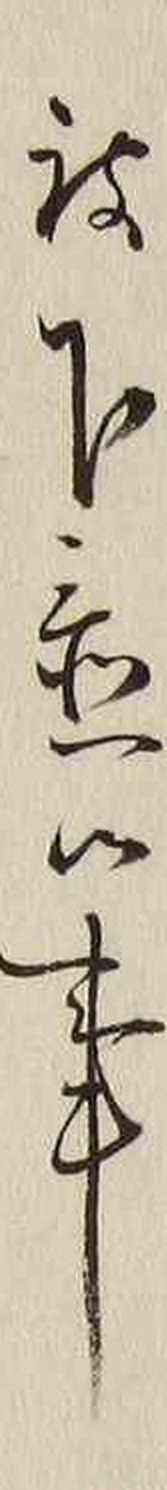被下置候事
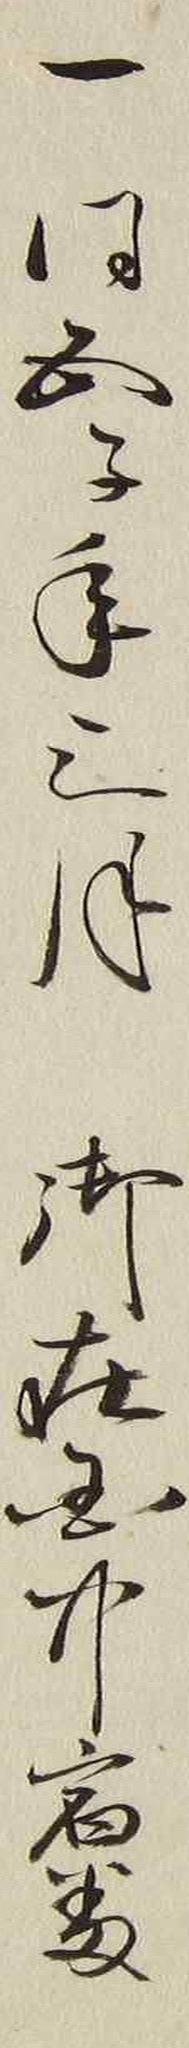一同五子年三月御在国中宿番
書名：諸士系譜　巻之163　な之部5
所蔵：会津若松市立会津図書館
